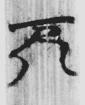厄
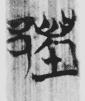{邑臼人土}
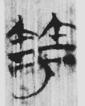竽
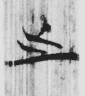之
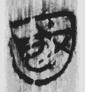國
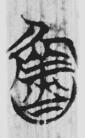魯
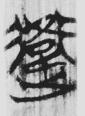{衛止}
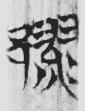鄝
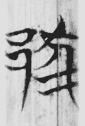○（蔡）
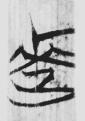麥
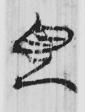見
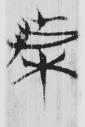枼
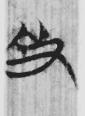及
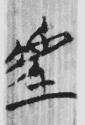𫊟
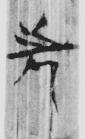先
